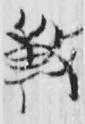○（捕）
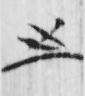之
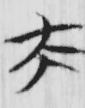夫
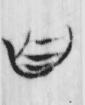自
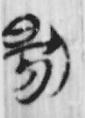傷
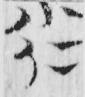小人
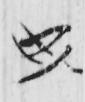𡚦（焉）
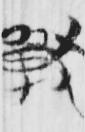獸（守）
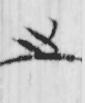之
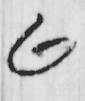㠯（以）
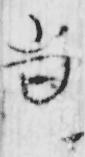告
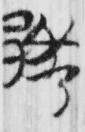秀
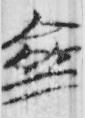齊
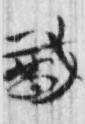戠
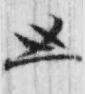之
